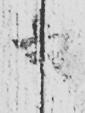七十=
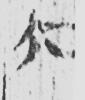六
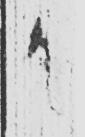千
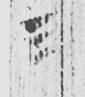三
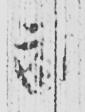百
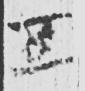五
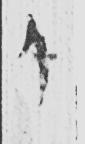千
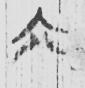六
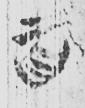百
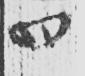四
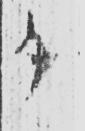千
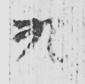九
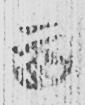百
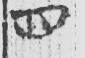四
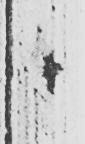千
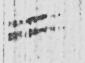二
